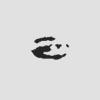妾
